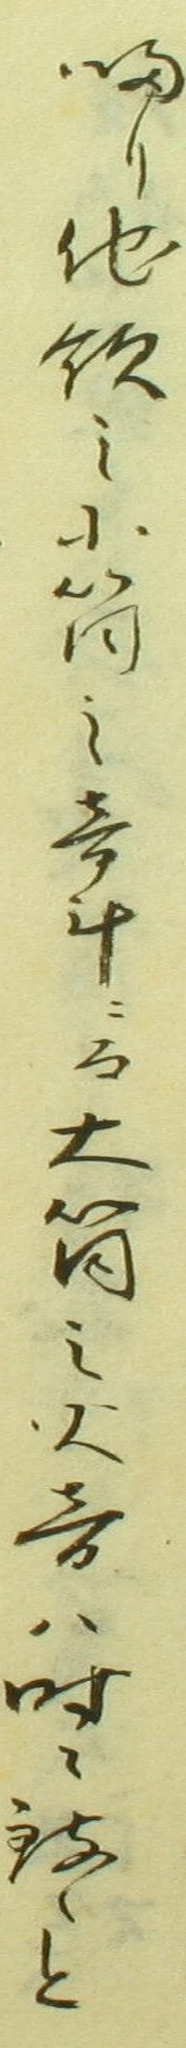帰り他領之小筒之音斗に而大筒之火音は時々致候と
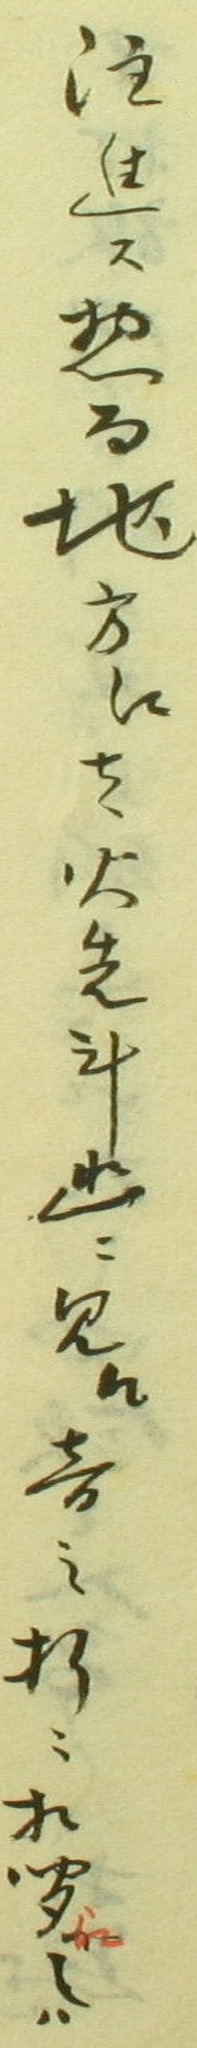注進ス惣而地方江は火先斗ニ見候音之折々相聞候ハ
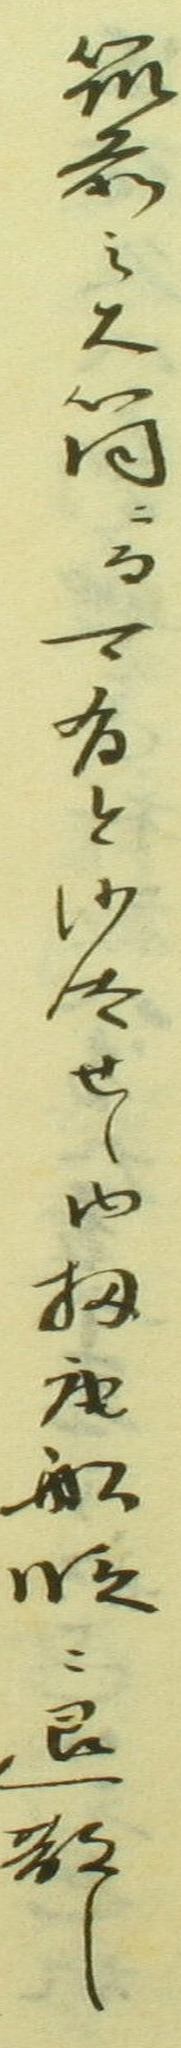筑前之大筒ニ而可有と沙汰せし内扨唐船段々退散し
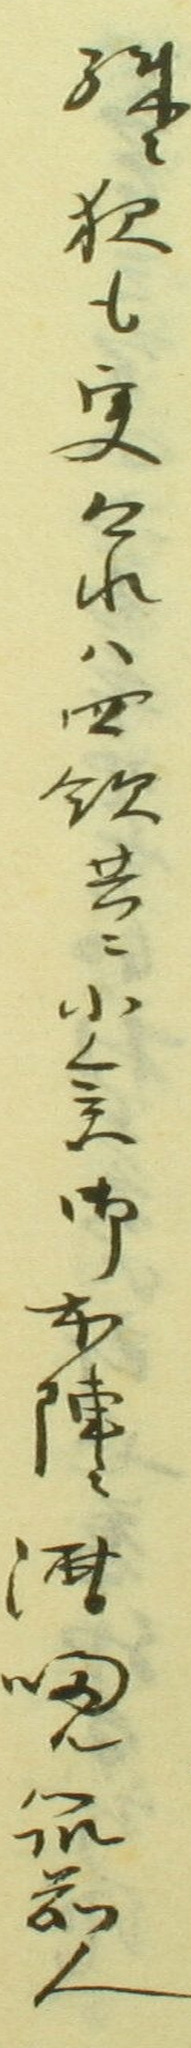殊ニ夜も更けれは四領共ニ小倉御本陣ニ漕帰候筑前人
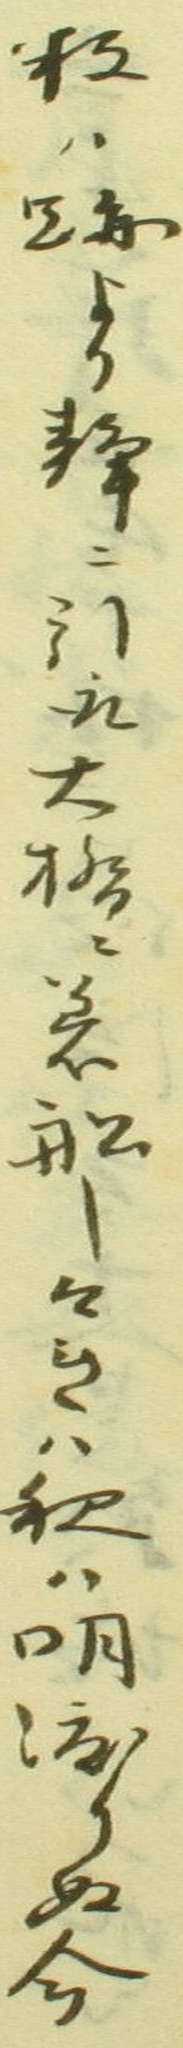数ハ跡より静ニ引取大橋ニ着船しけれは夜ハ明渡りぬ今
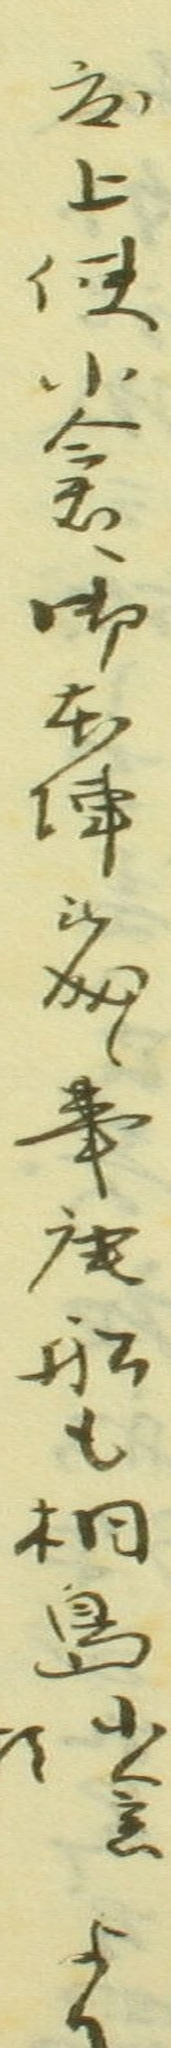度上使小倉へ御本陣被成候事唐船も相島小倉領より
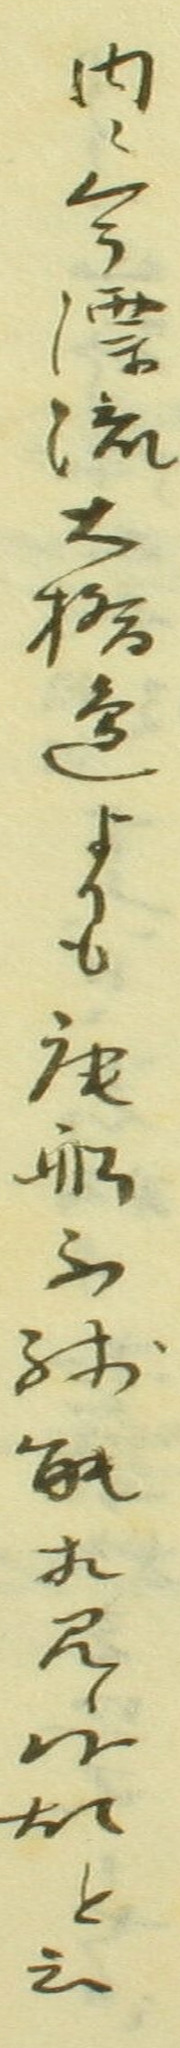内ニ今漂流大橋辺よりも唐船不残能相見候故と云
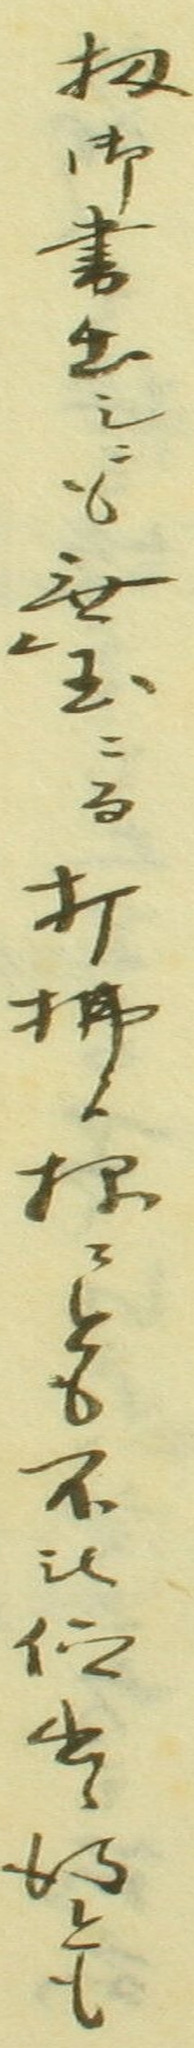扨御書出しにも無玉ニ而打払候様にとも不被仰出候得とも
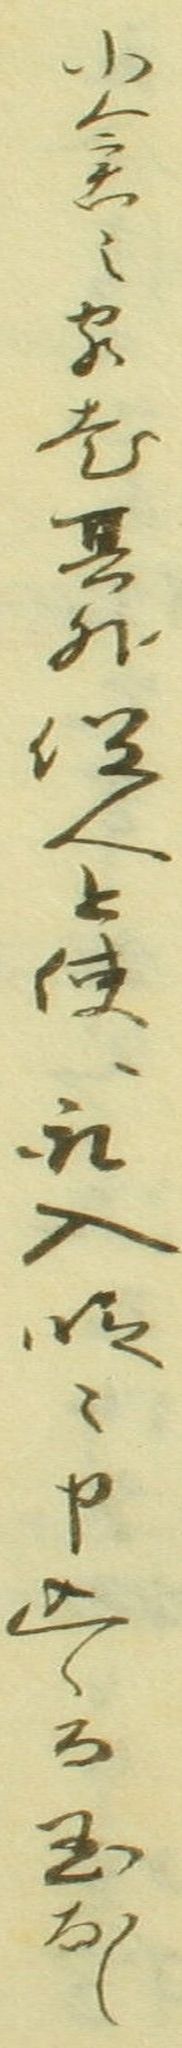小倉之家老其外役人と使へ取入段々申込候而玉なし
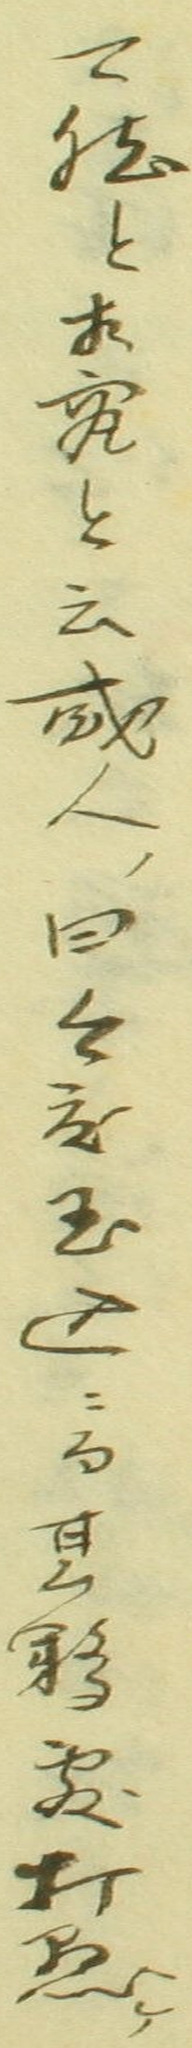可然と相究と云或人ノ曰今度玉込ニ而其夥敷打懸ケ
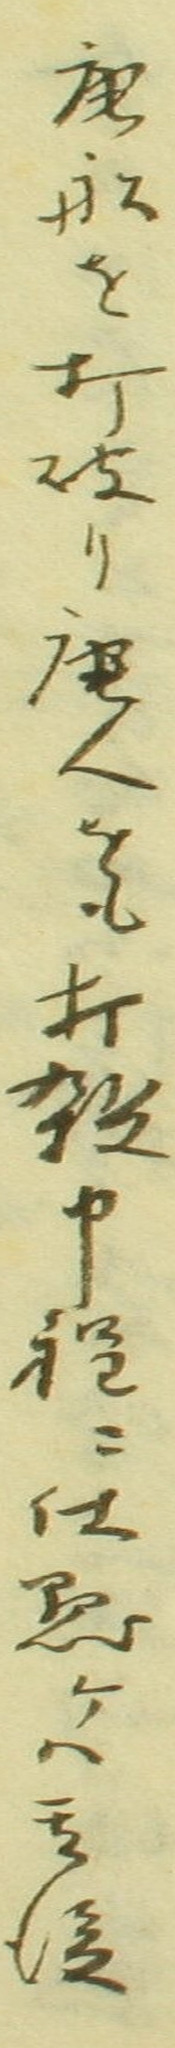唐船を打破り唐人をも打殺申程ニ仕懸ケハ其後
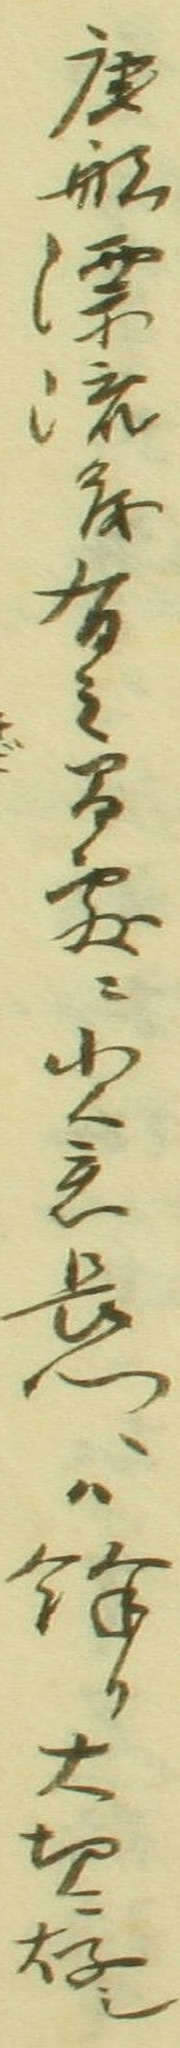唐船漂流も有之間敷ニ小倉長門へは餘り大切ニ存し
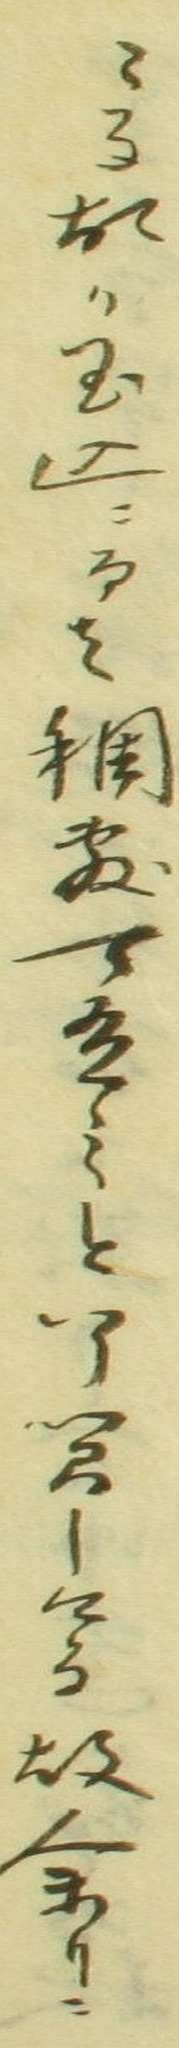候事故か玉込ニ而は稠敷可有之と了簡しける故余りに
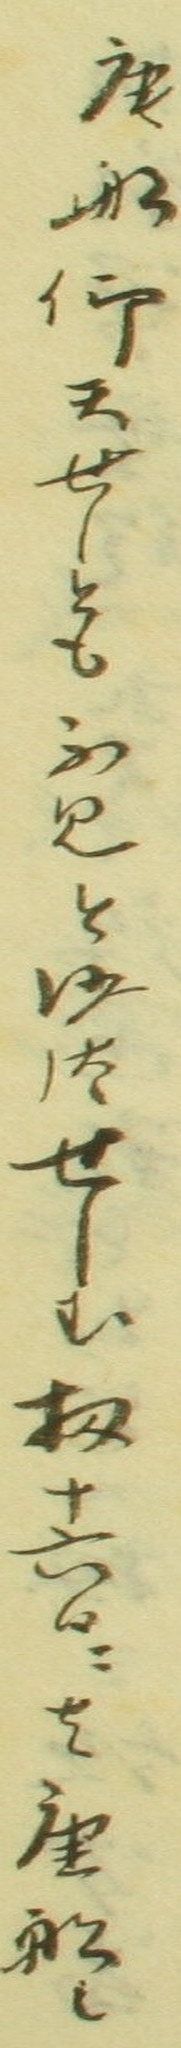唐船仰天せしとも不見と沙汰せしむ扨十六日には唐船も

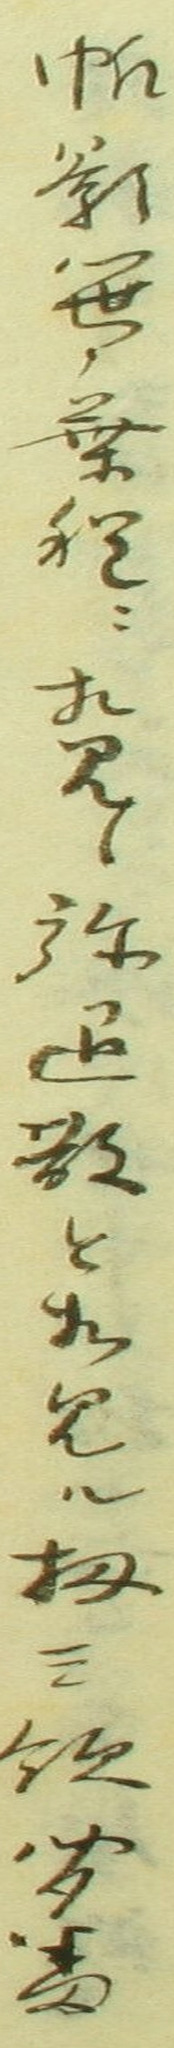帆影笹ノ葉程ニ相見候弥退散と相見ル扨三領聞番
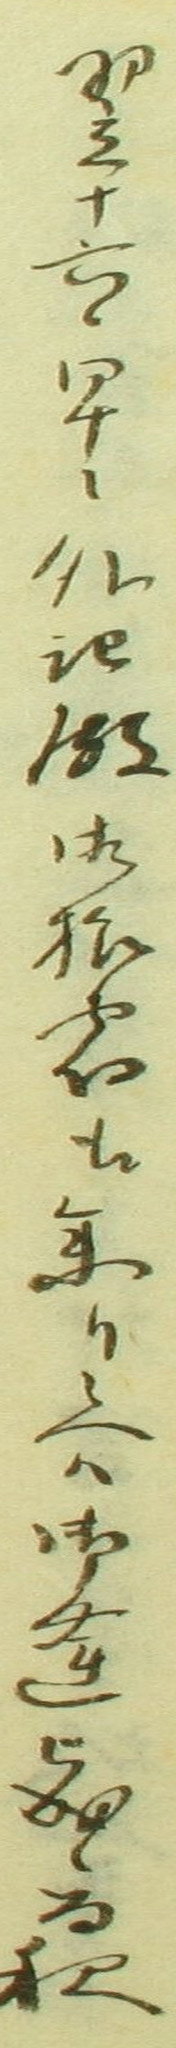翌十六日早々外記殿御旅宿江参り候へは御逢被成候而夜
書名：唐船漂流記 二
